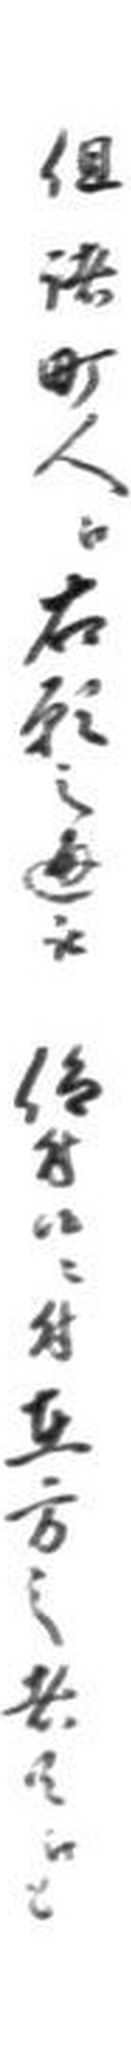但諸町人江右願之通被仰付候ニ付在方之者共江も
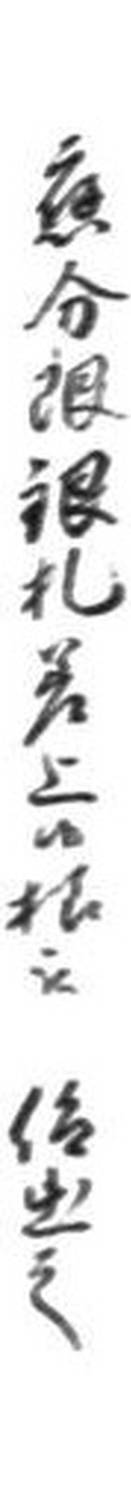応分限銀札差上候様被仰出之
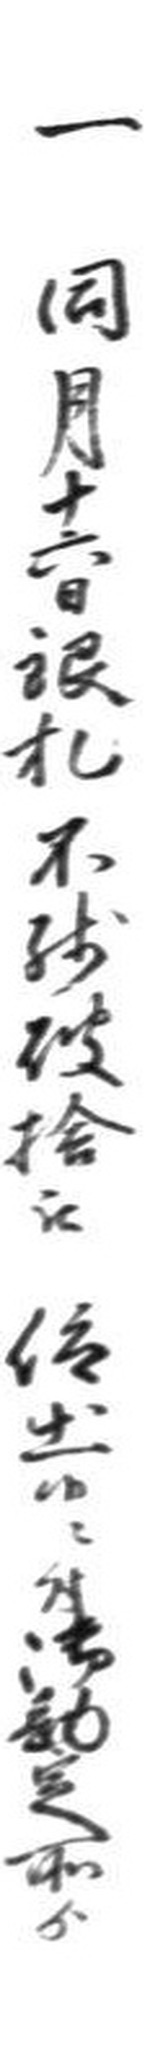一同月十六日銀札不残破捨被仰出候ニ付御勘定所ゟ

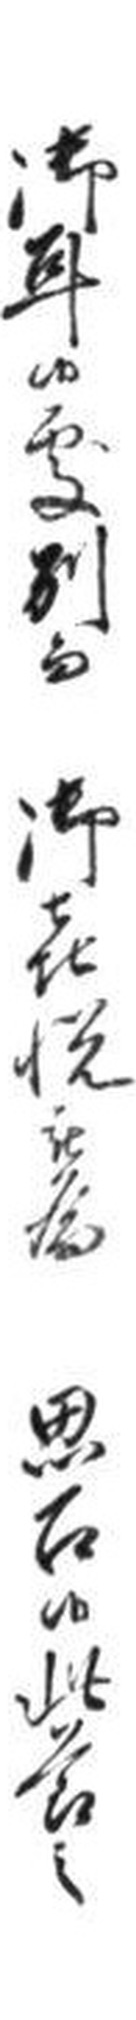御耳候處別而御喜悦被成思召候此節之
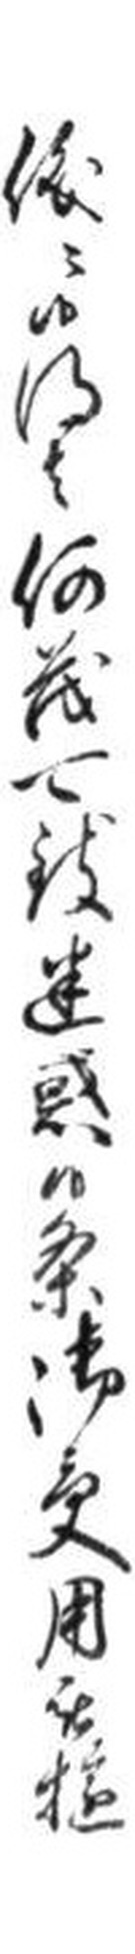儀ニ候得者何茂可致迷惑候条御受用被遊
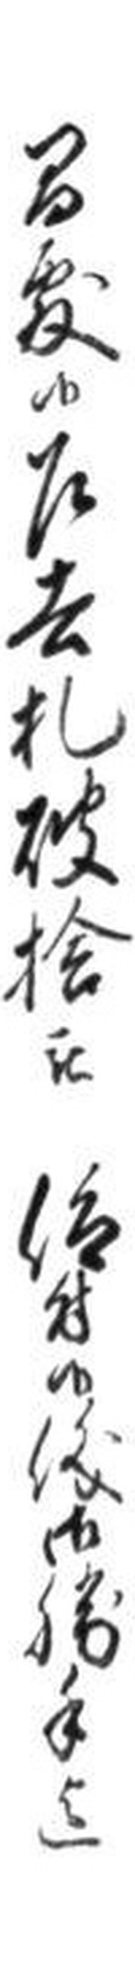間敷候乍去札破捨被仰付候儀御勝手迄
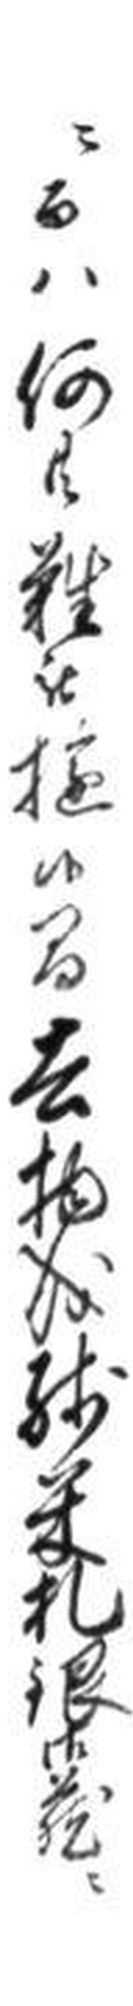ニ而ハ何共難被遊候間去物成残米札銀御蔵ニ
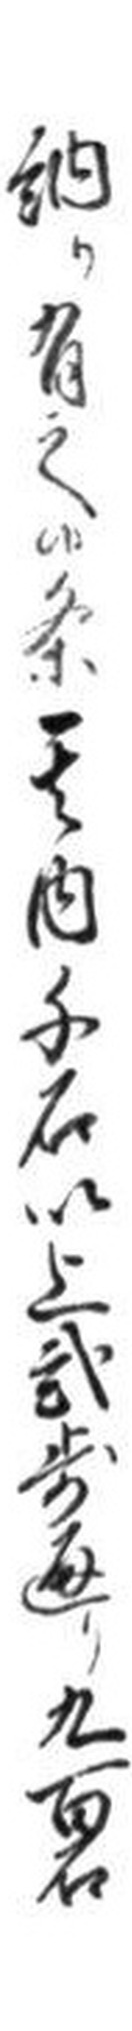納り有之候条其内千石以上弐歩通り九百石
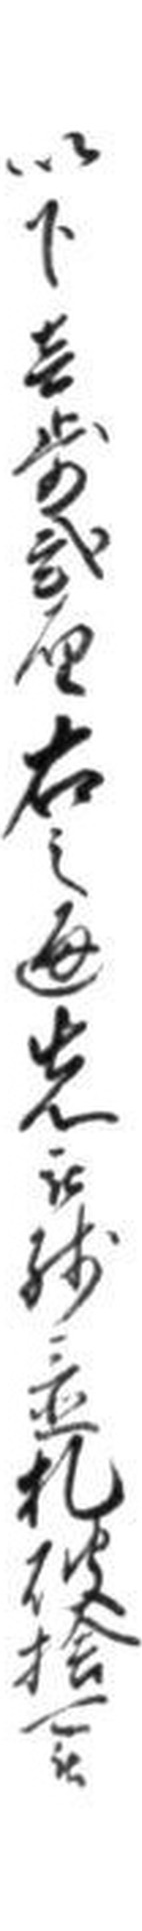以下壱歩弐厘右之通先被残置札破捨可被
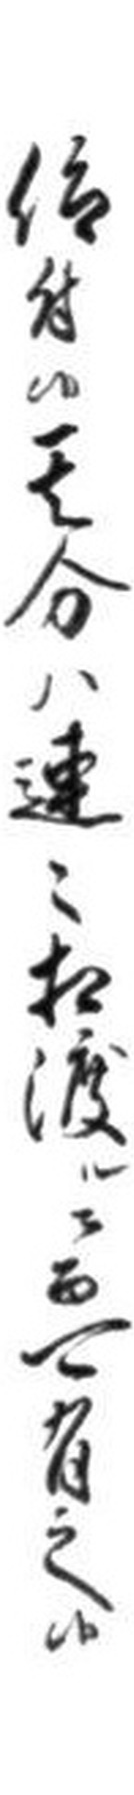仰付候其分ハ速々相渡ルニ而可有之候
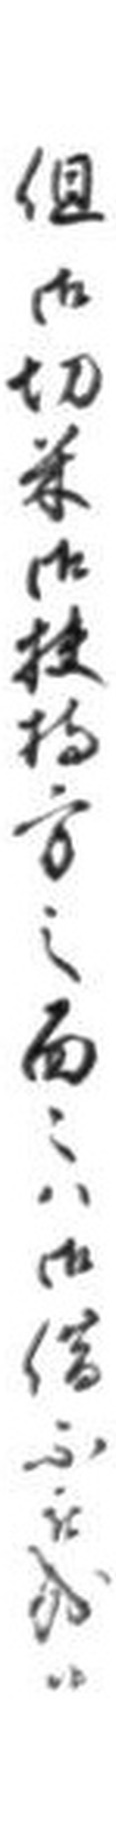但御切米御扶持方之面々ハ御借不被成候
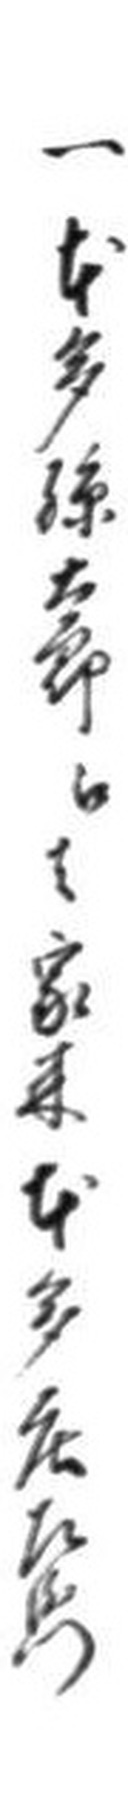一本多孫太郎江者家来本多庄左衛門
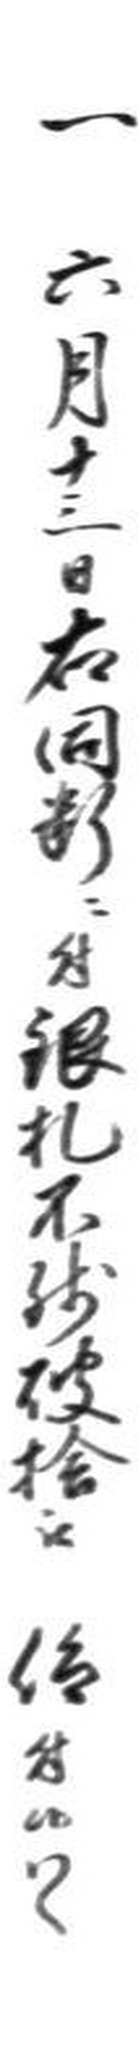一六月十三日右同断ニ付銀札不残破捨被仰付候ハヽ
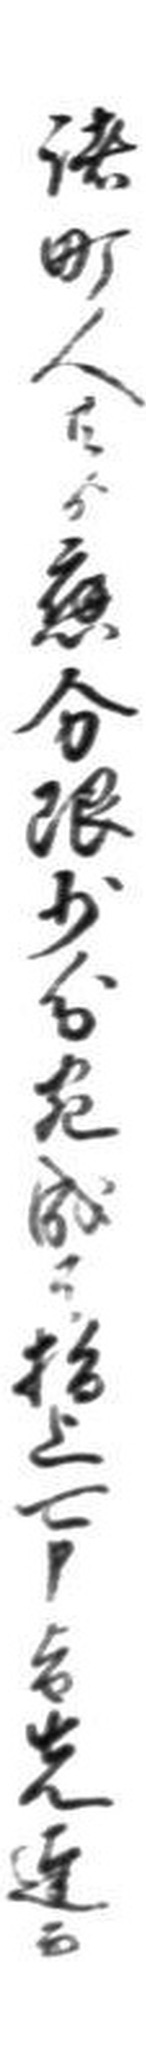諸町人共ゟ応分限少分宛成共指上可申旨先達而
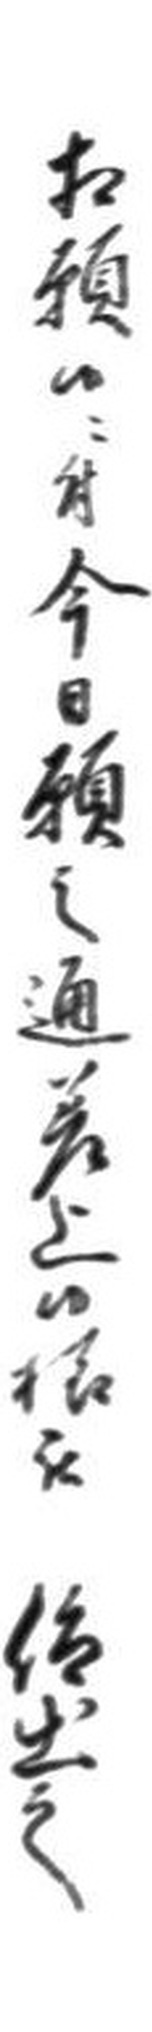相願候ニ付今日願之通差上候様被仰出之
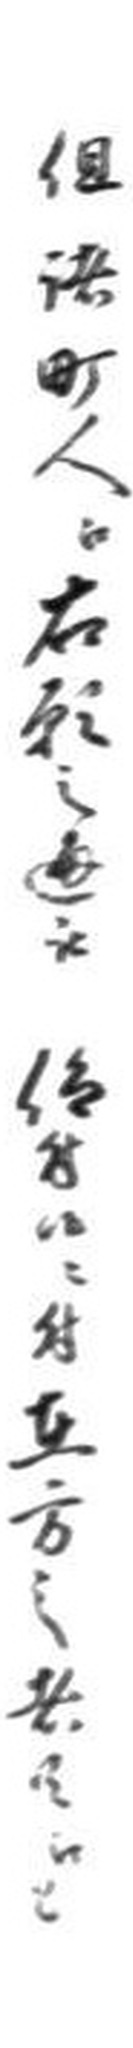但諸町人江右願之通被仰付候ニ付在方之者共江も
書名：家譜 十六 吉品公 従貞享三年閏三月到同四年
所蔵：福井県文書館 Fukui Prefectural Archives
